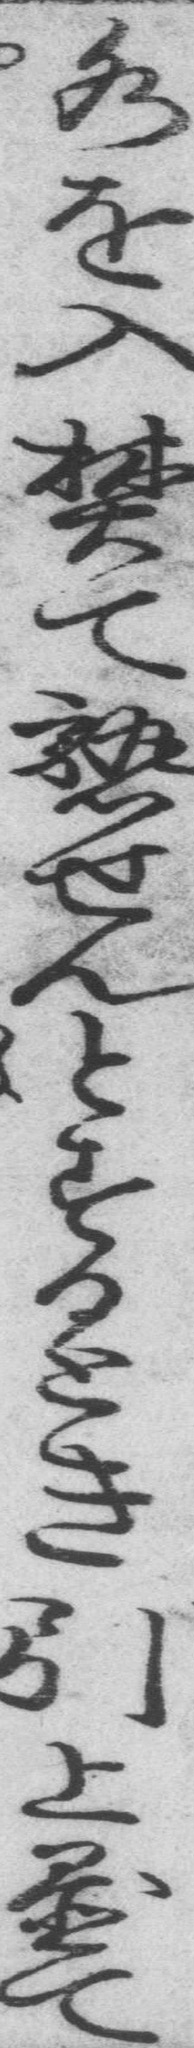水を入焚て熟せんと春るとき引上置て
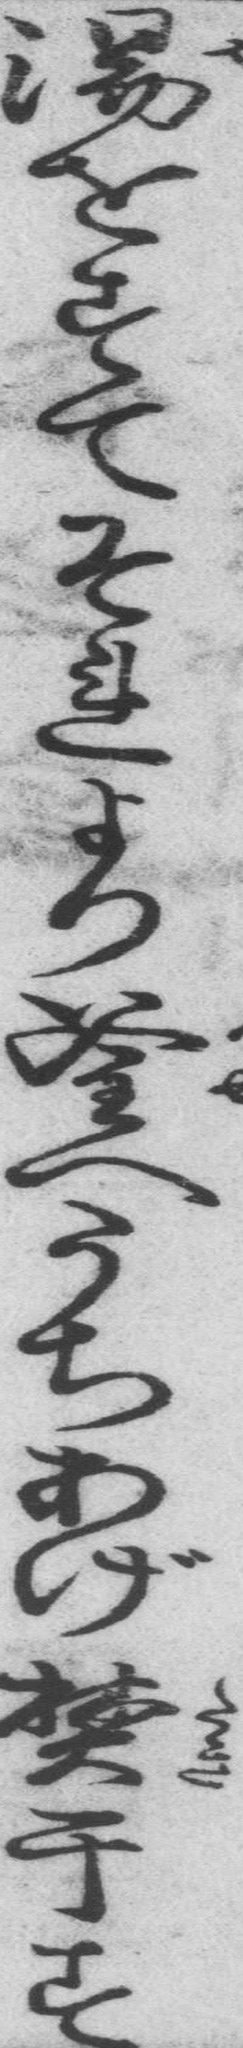湯を春てそ連より釜へうちあげ焚干春
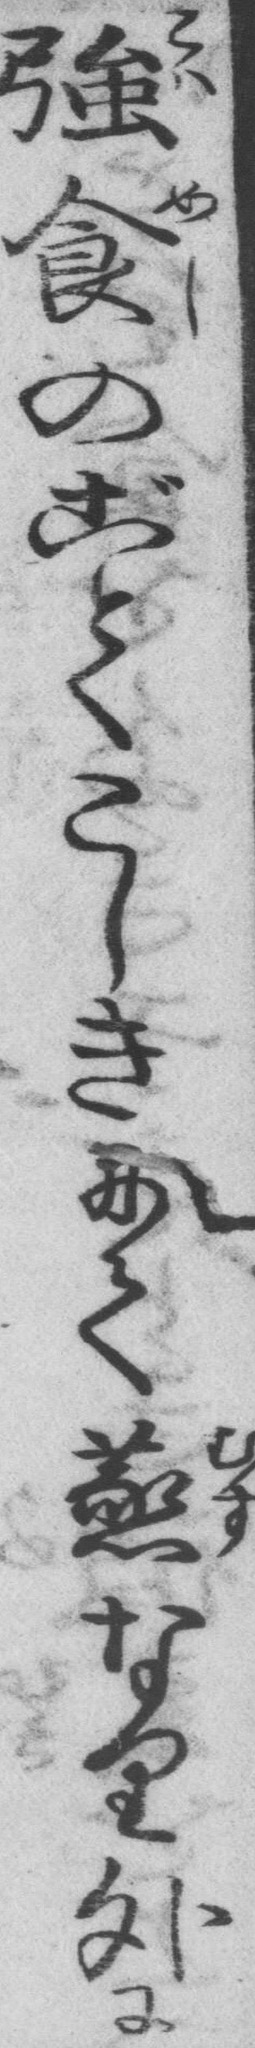強食の古とくこしき丹て蒸な里外尓
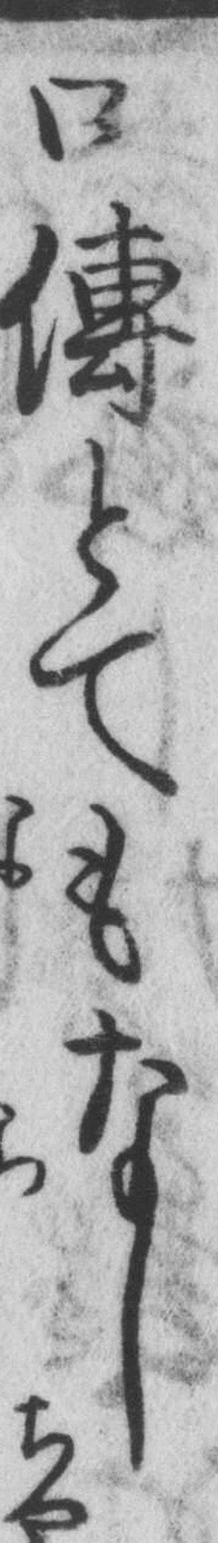口傳とてもなし
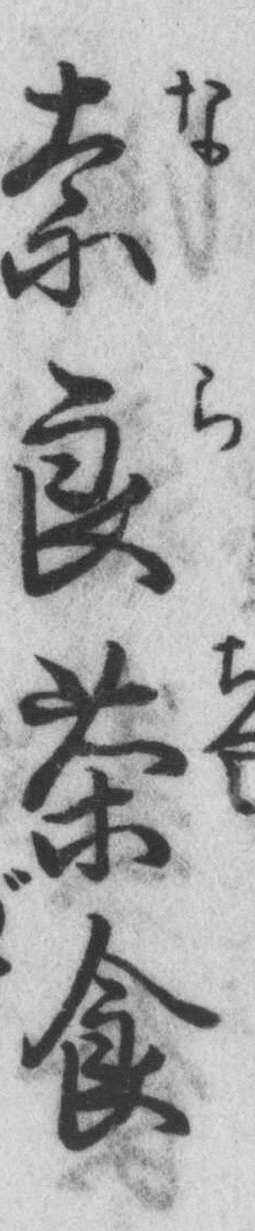奈良茶食
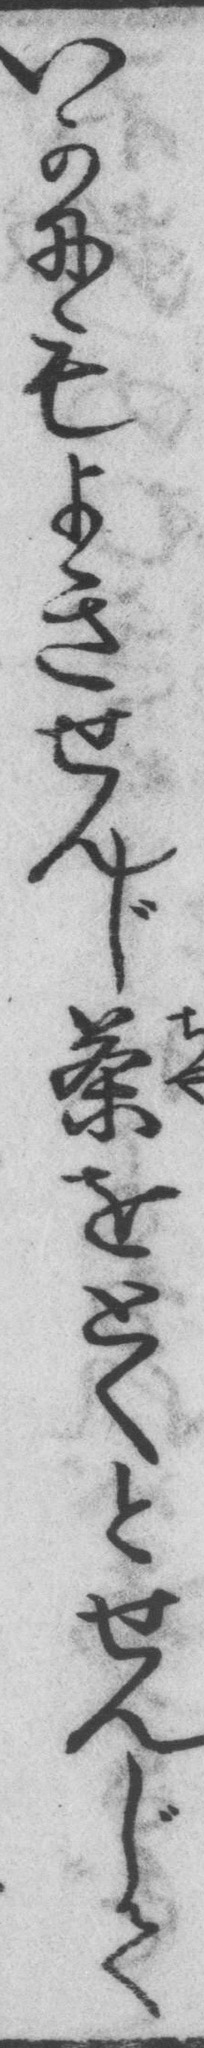い可丹もよきせんじ茶をとくとせんじて
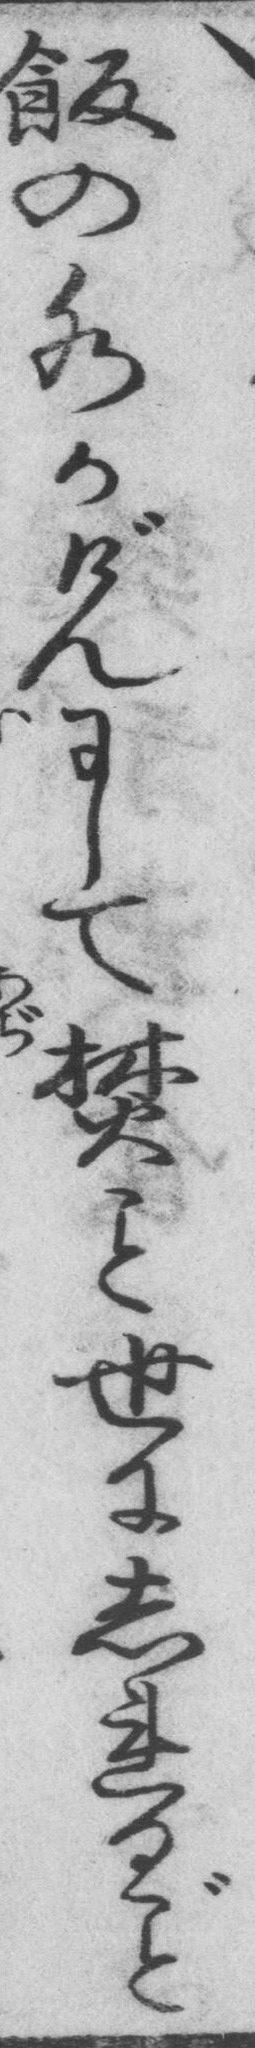飯の水かげん尓して炊く焚こと世尓志連るごと
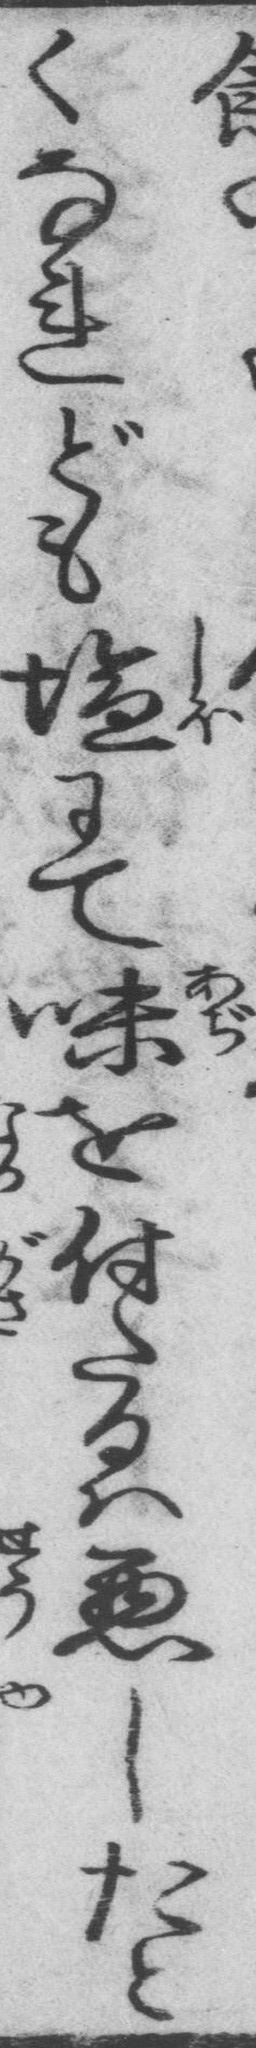くな連ども塩尓て味を付たるは悪したと
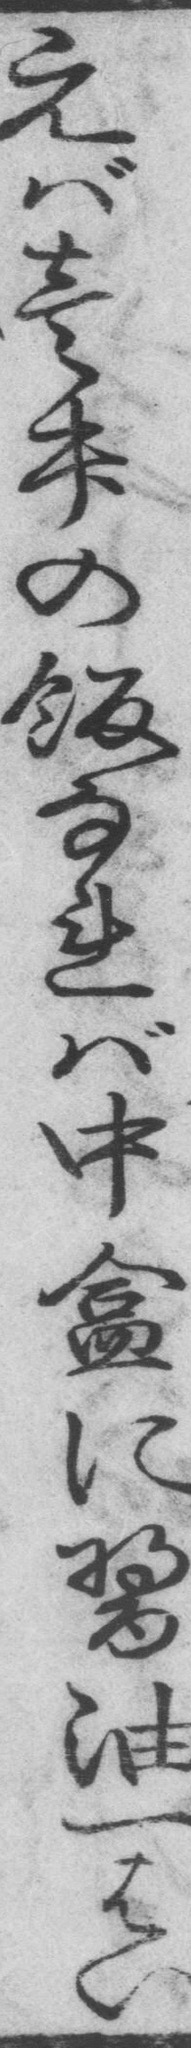えば壱升の飯な連ば中盒に醤油一はい
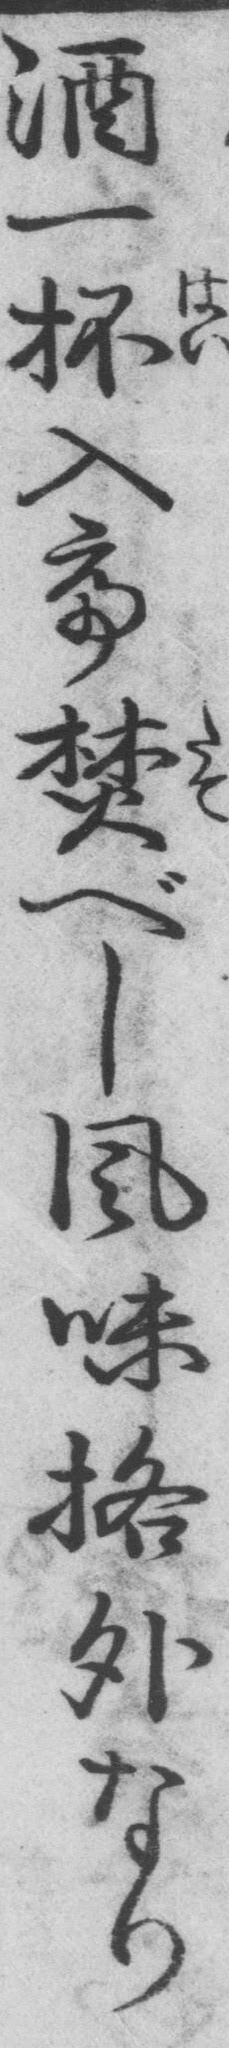酒一杯入亭焚べし風味格外ななり

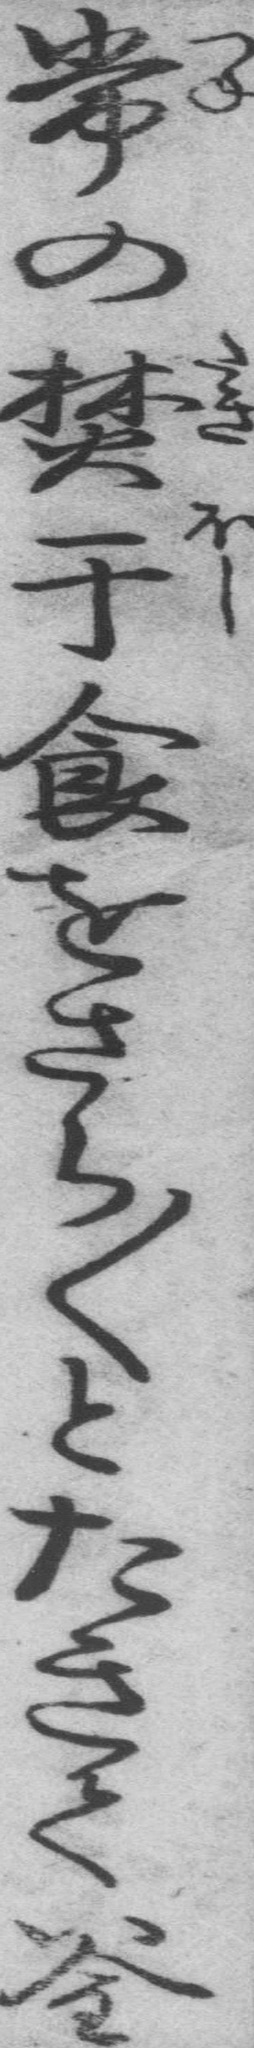常の焚干食をさら〳〵とたきて釜
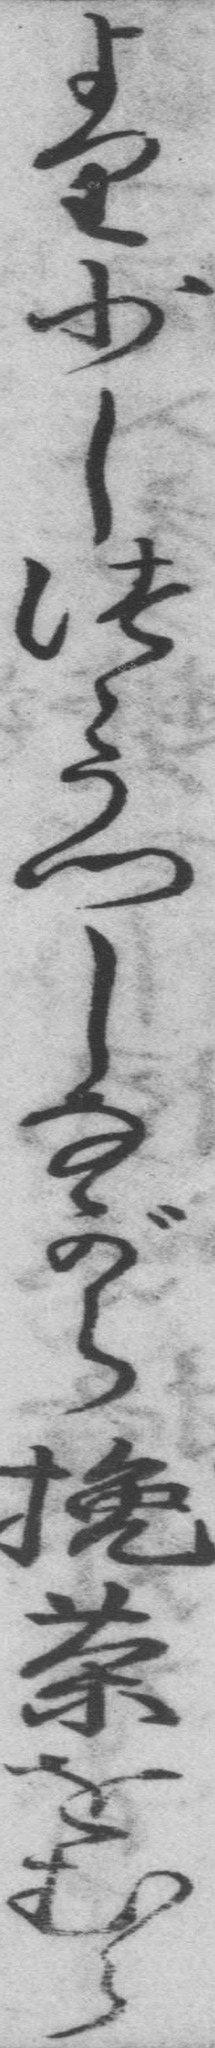よ里少し徒々うつしながら挽茶をむら
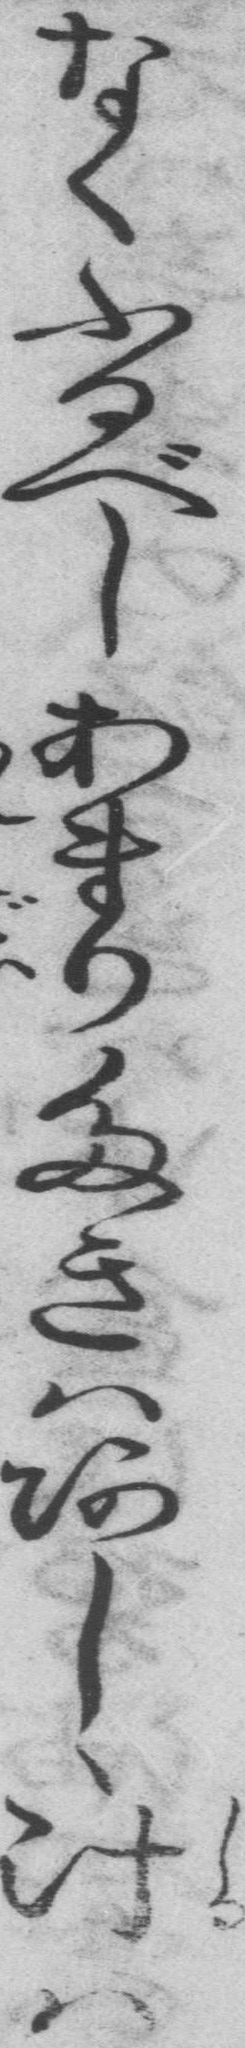なくふるべしあまり多きは阿しく汁は
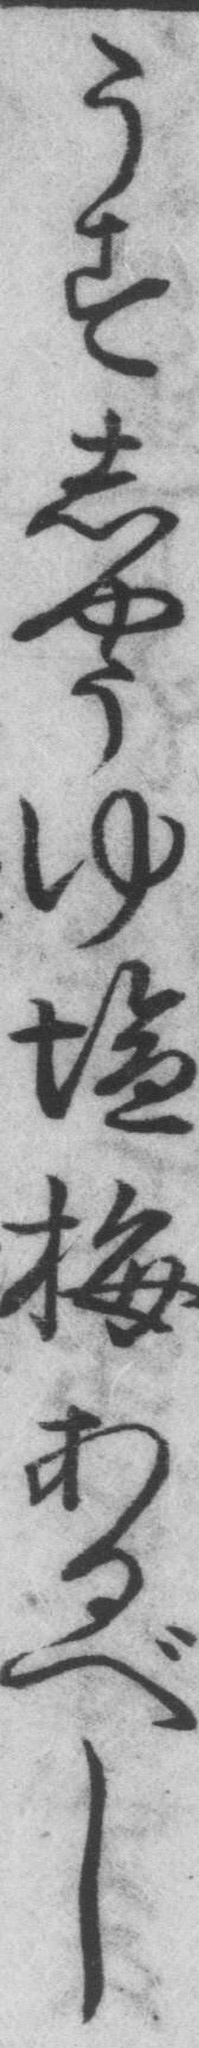う春志やうゆ塩梅あるべし
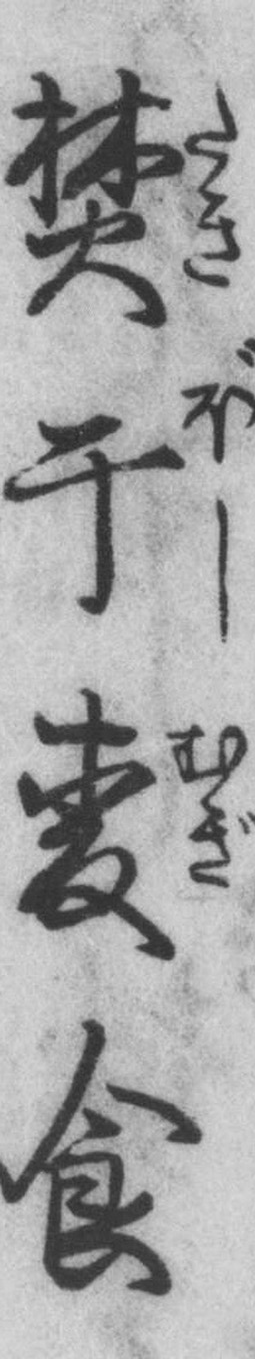焚干麦食
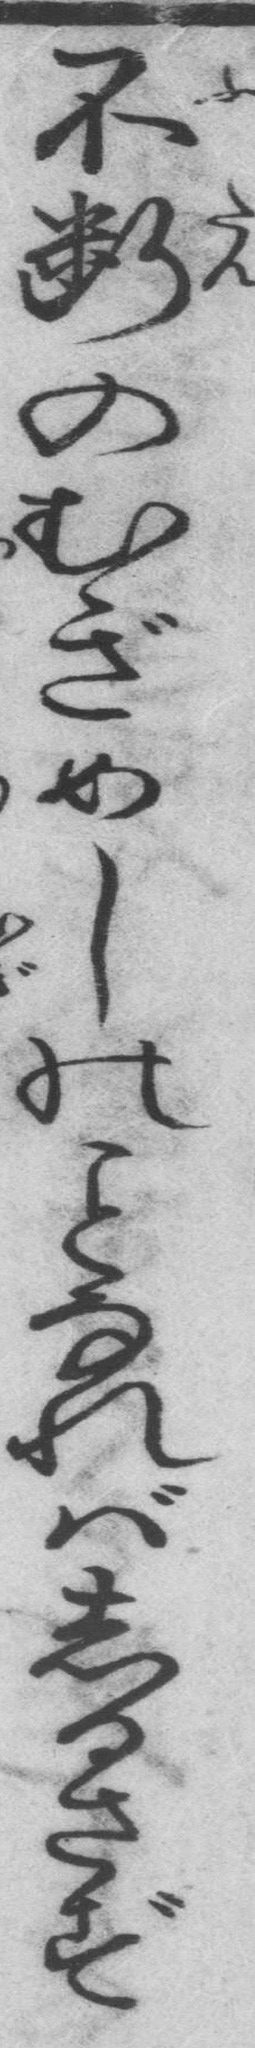不断のむぎめし能ことなれば志るさず
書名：料理伊呂波庖丁
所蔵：大阪府立大学学術情報センター 国文学研究資料館
